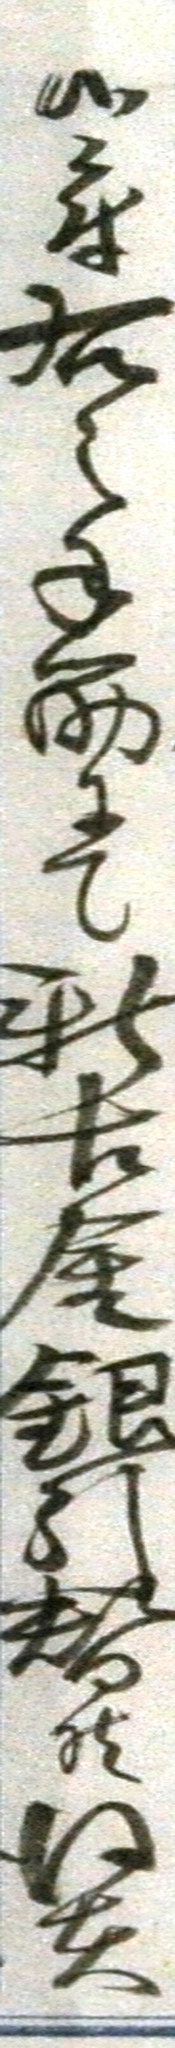候に付右之手筋にて新古金銀引替候得ば
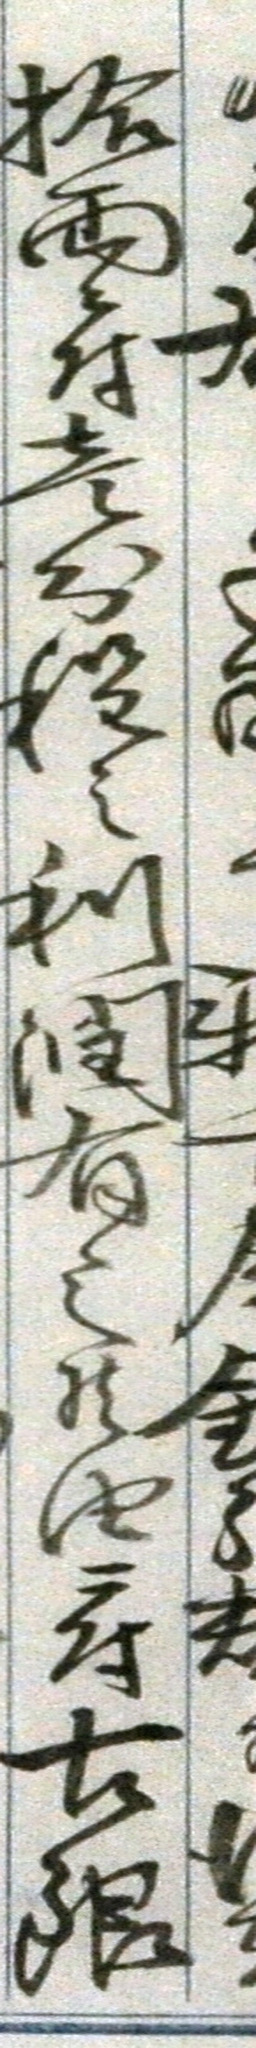拾両に付壱分程之利潤有之候由に付古銀
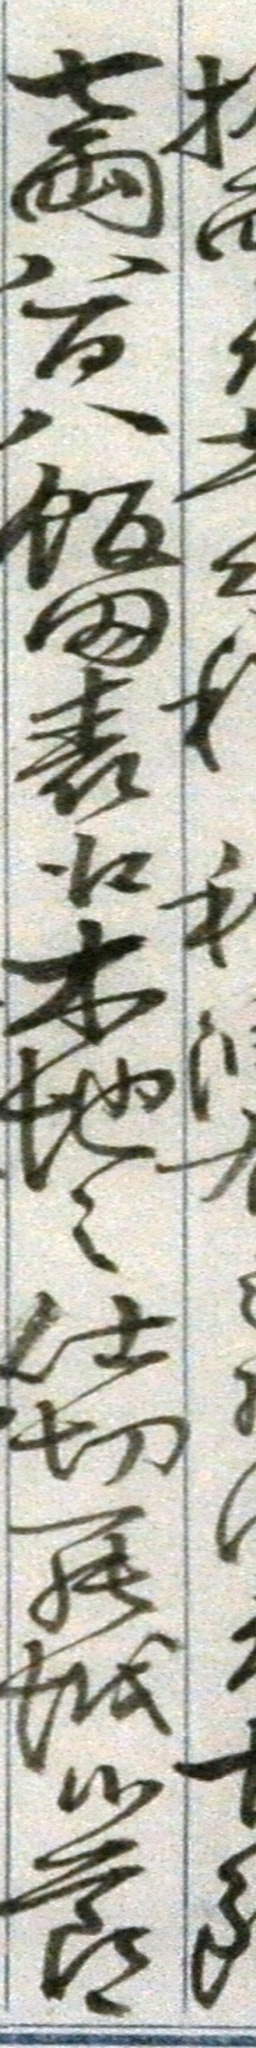七両八百八飯田表え木地之仕切罷越候節
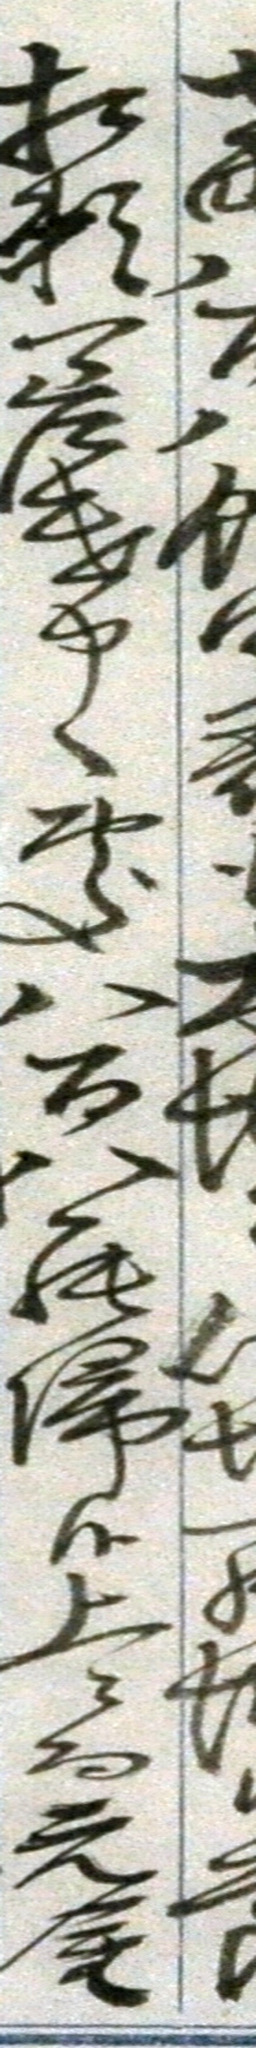相頼差遣申候処八百八罷帰候上に而元金
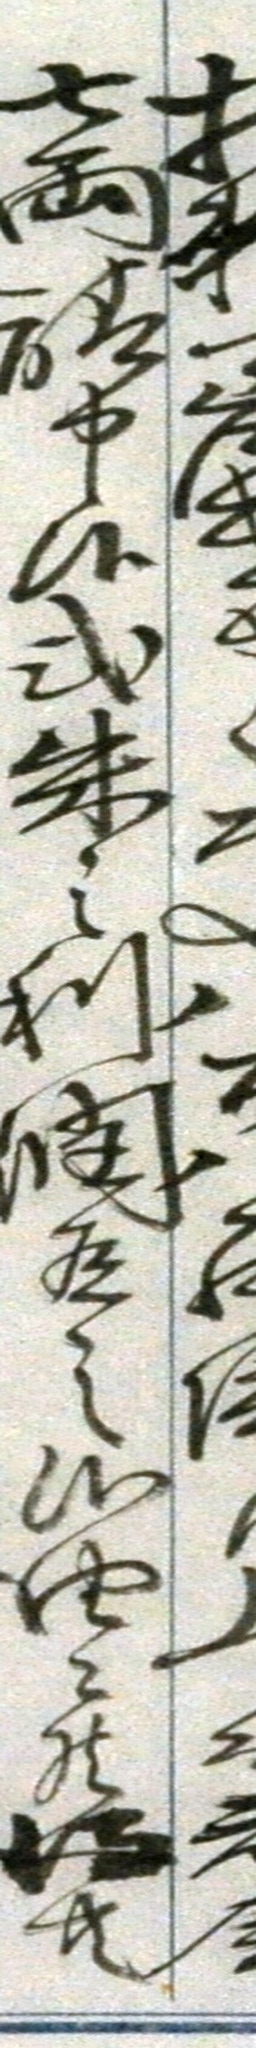七両請申候弐朱之利潤有之候由に候得共
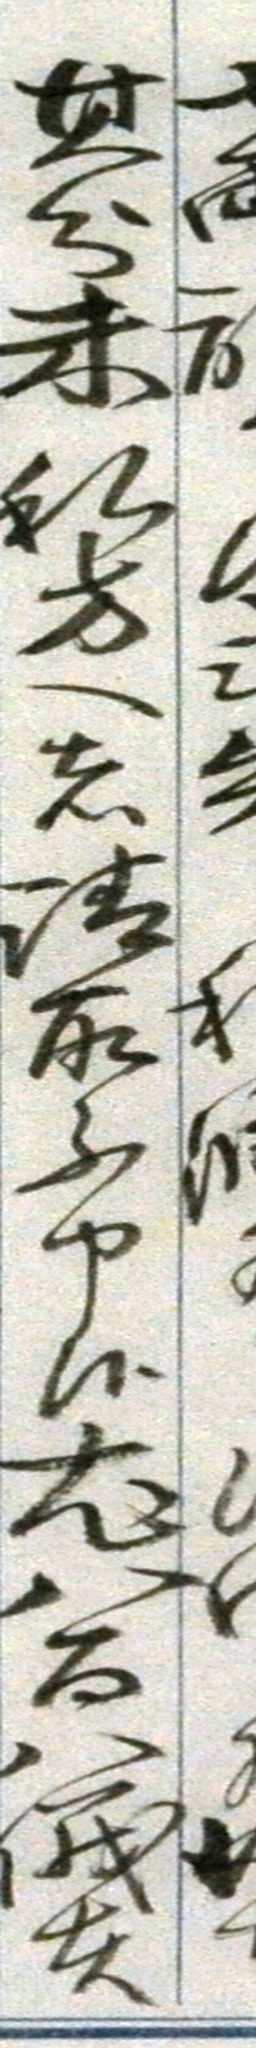其分未私方へは請取不申候尤八百八儀は
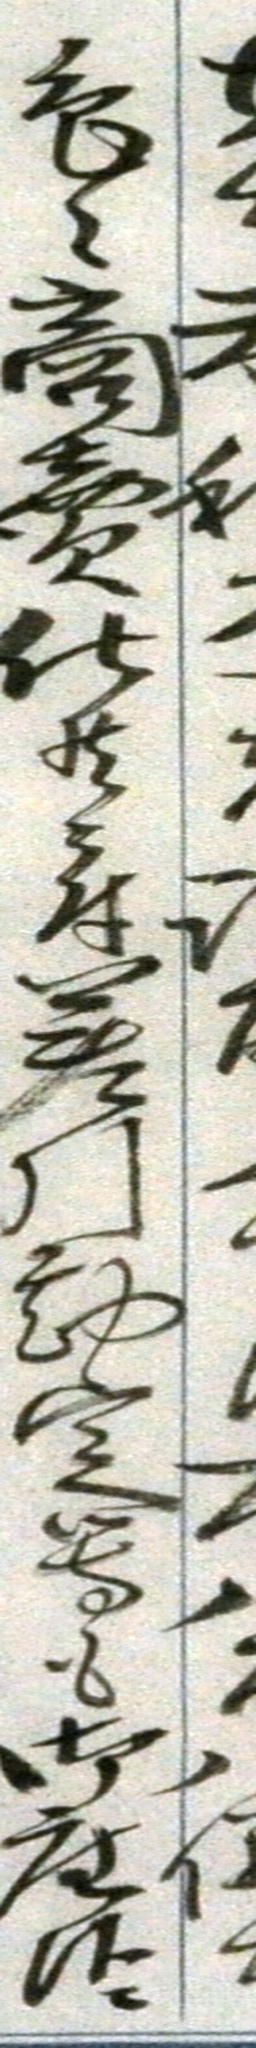色々商売仕候に付差引勘定等も御座候に
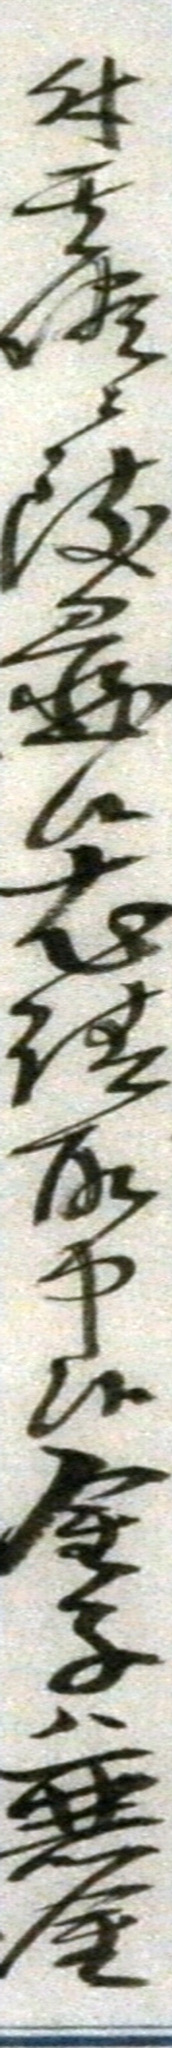付其儘に致置候尤請取申候金子は悪金
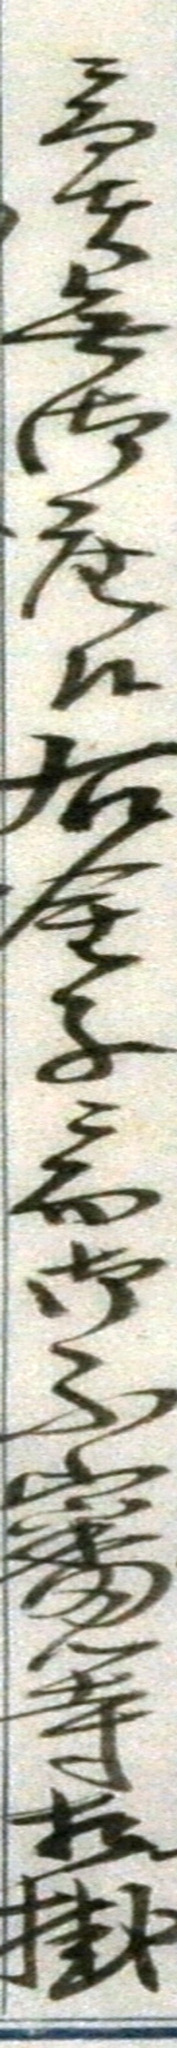に而は無御座候右金子に而御不審等相掛
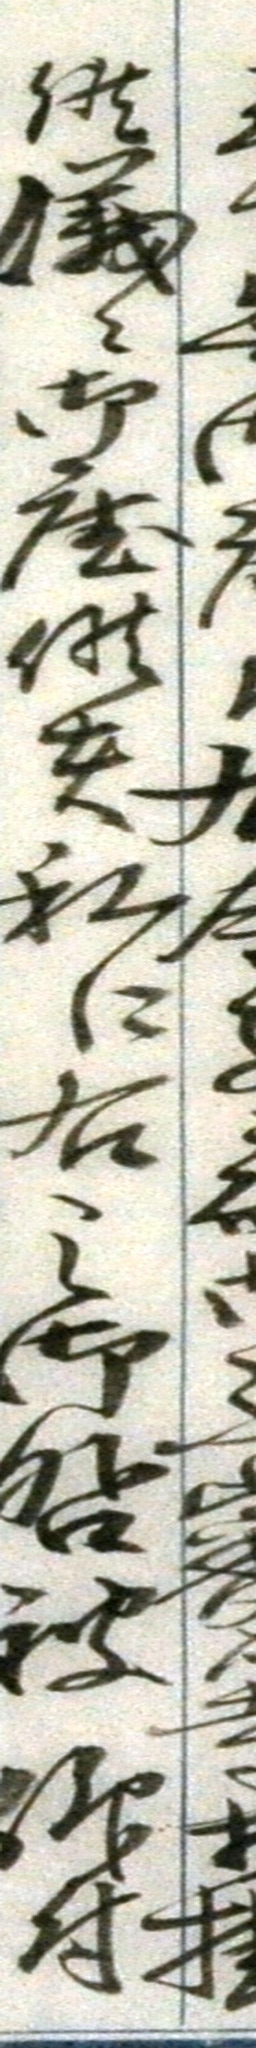候儀に御座候は私に右之御咎被仰付
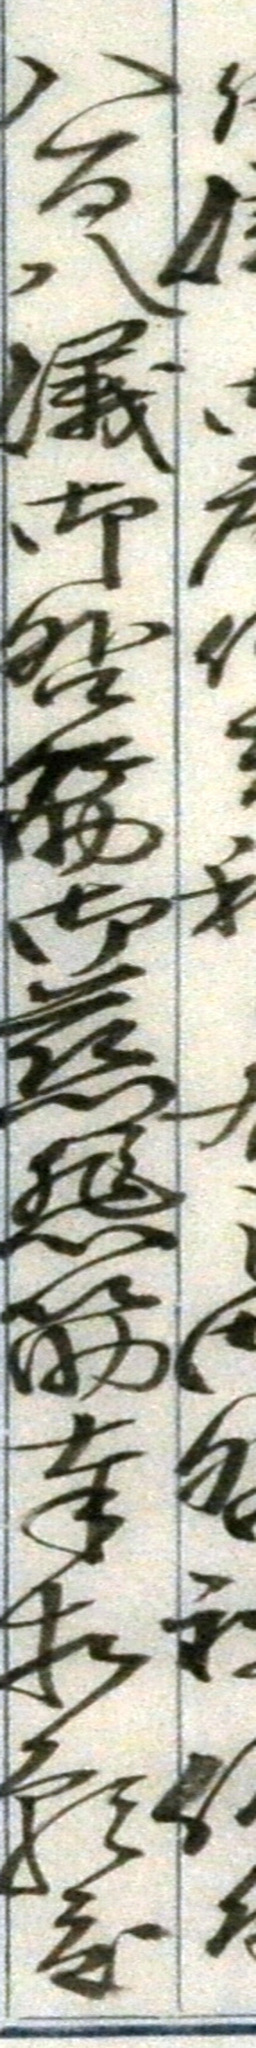八百八儀御咎筋御慈悲筋奉相願度
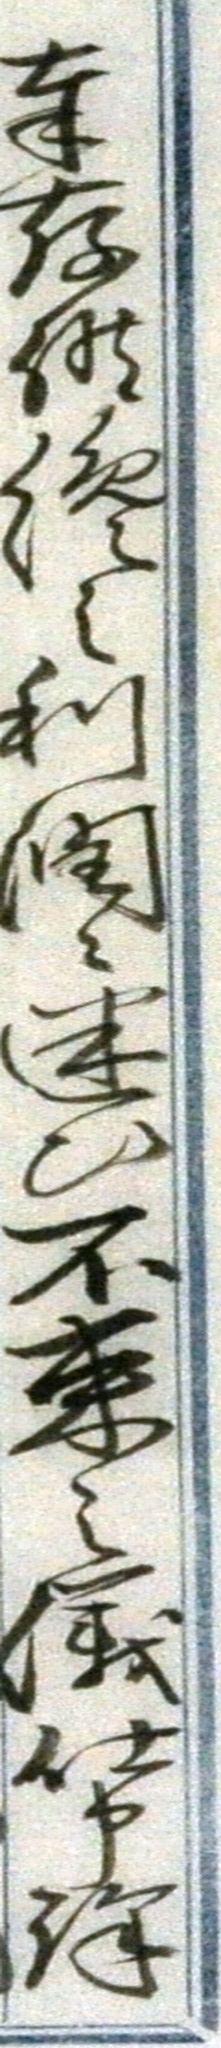奉存候纔之利潤に迷ひ不束之儀仕申訳
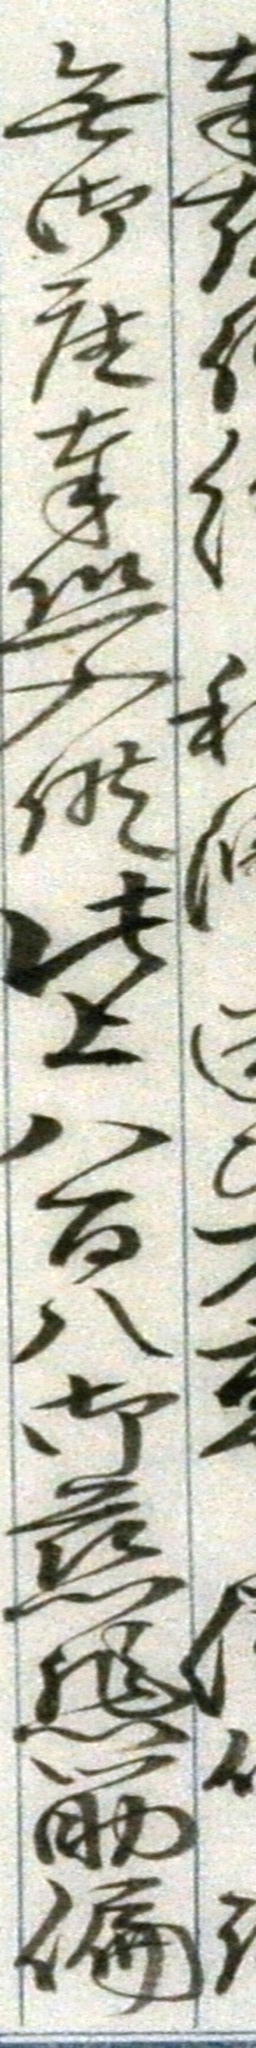無御座奉恐入候以上八百八御慈悲筋偏
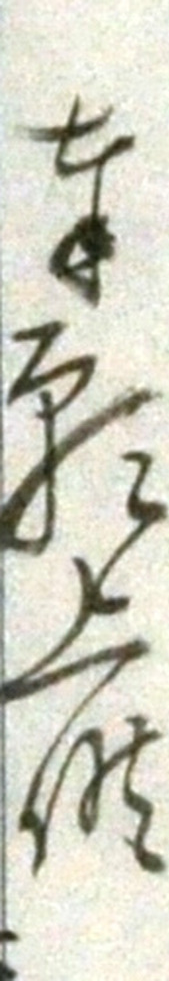奉願上候
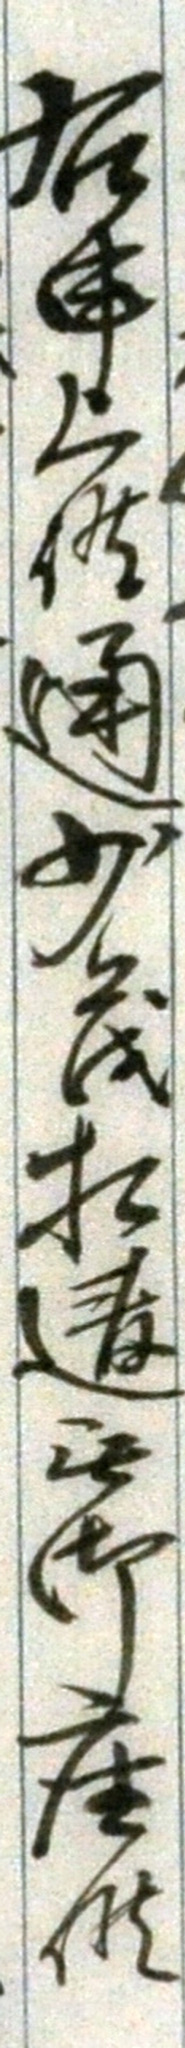右申上候通少も相違無御座候
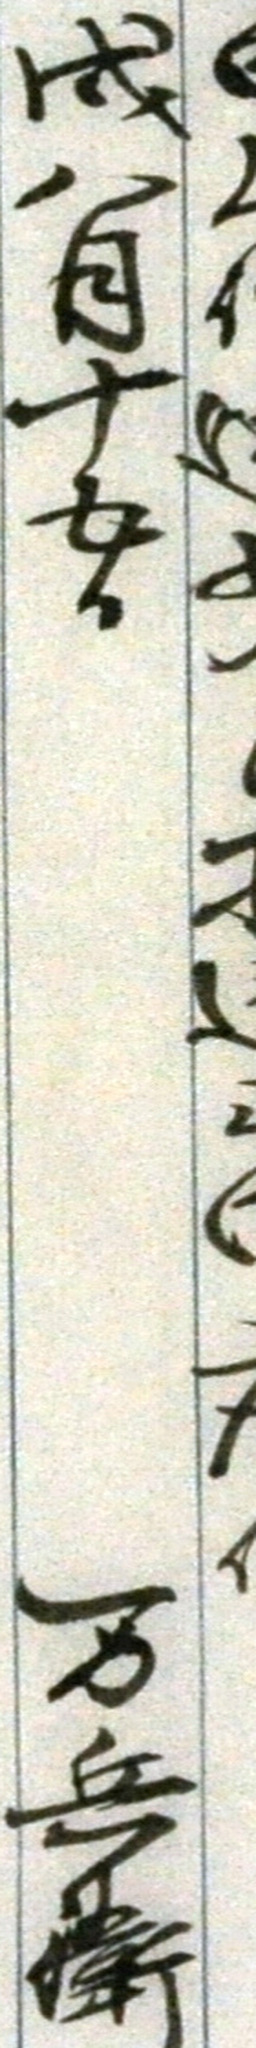戌八月十五日万兵衛
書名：贋金之儀ニ付御尋之答
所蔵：伊那市立高遠町図書館・合同会社AMANE
